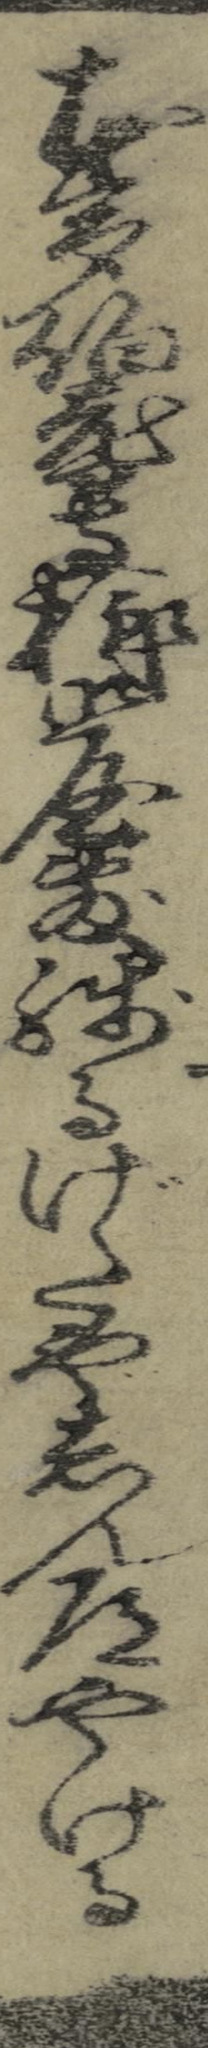本多伯耆守様御屋敷残るげたやしん道やける
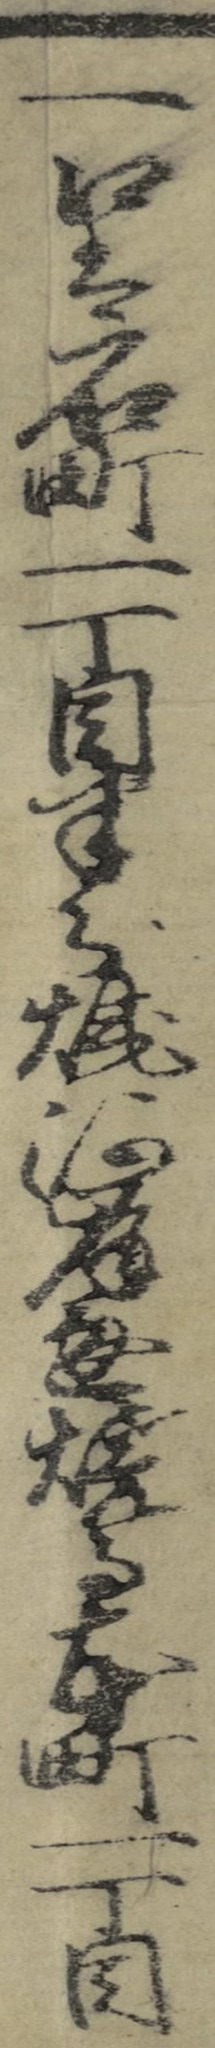一口は石町一丁目半分焼ハ河屋焼る本町一丁目
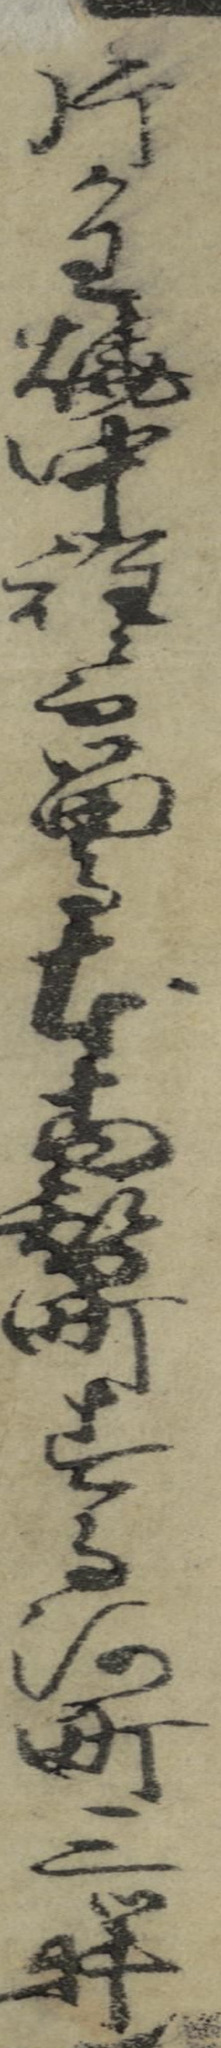片かわ焼中程二而留る本番勢町する河町三ツ井
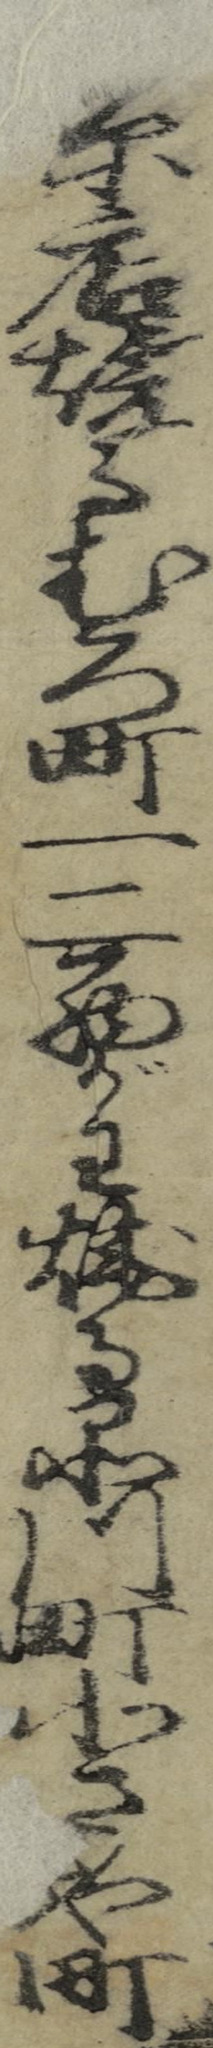原店焼るむろ町一二西がわ焼る北川町小さや町
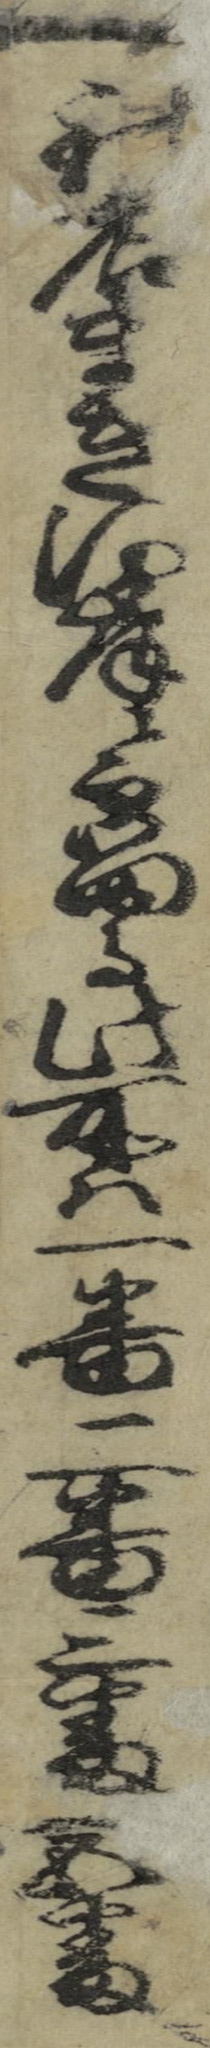鉄店まき河岸二而留る此所ハ一番二番三番五番
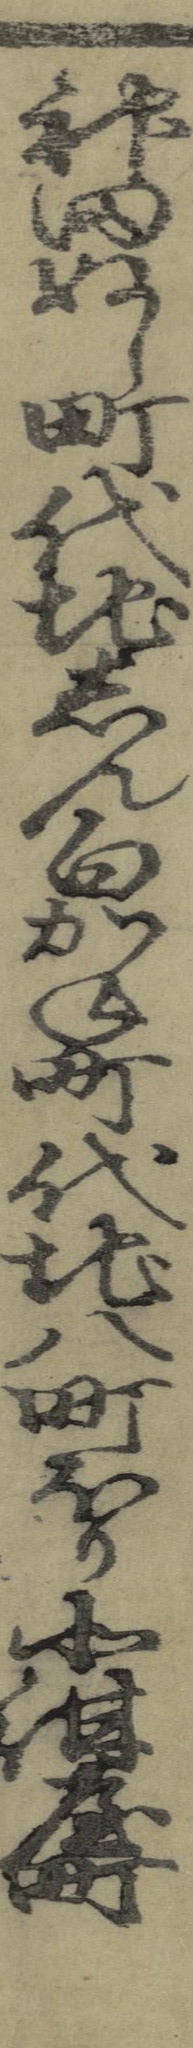神田ぬし町代地しん白かね町代地八町ほり北紺屋町
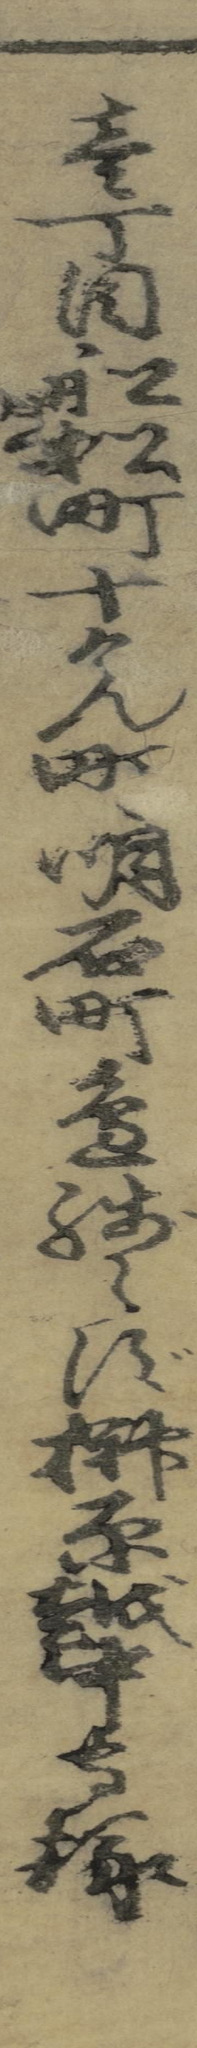壱丁目船松町十けん町明石町辺残らず榊原越中守様
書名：焼場方角附
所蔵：東京大学地震研究所図書室 Earthquake Research Institute Library, The University of Tokyo, JAPAN
